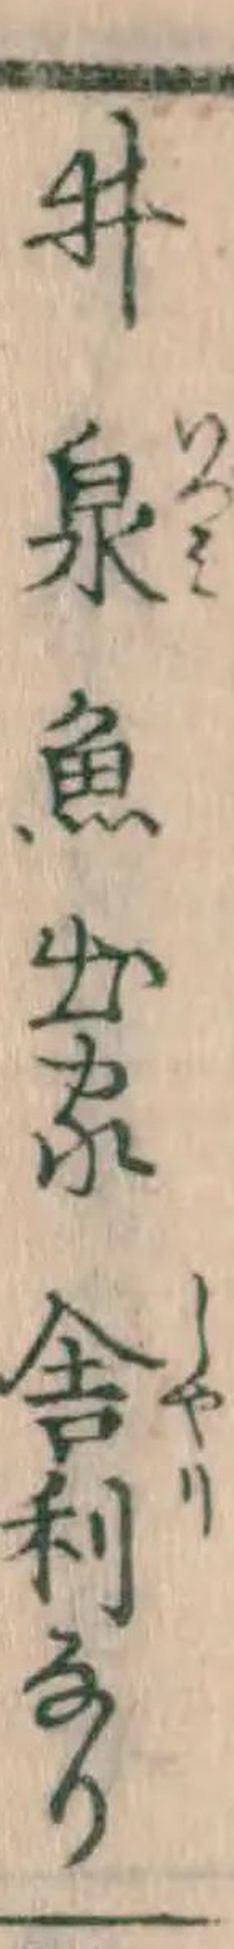井泉魚出家舎利なり
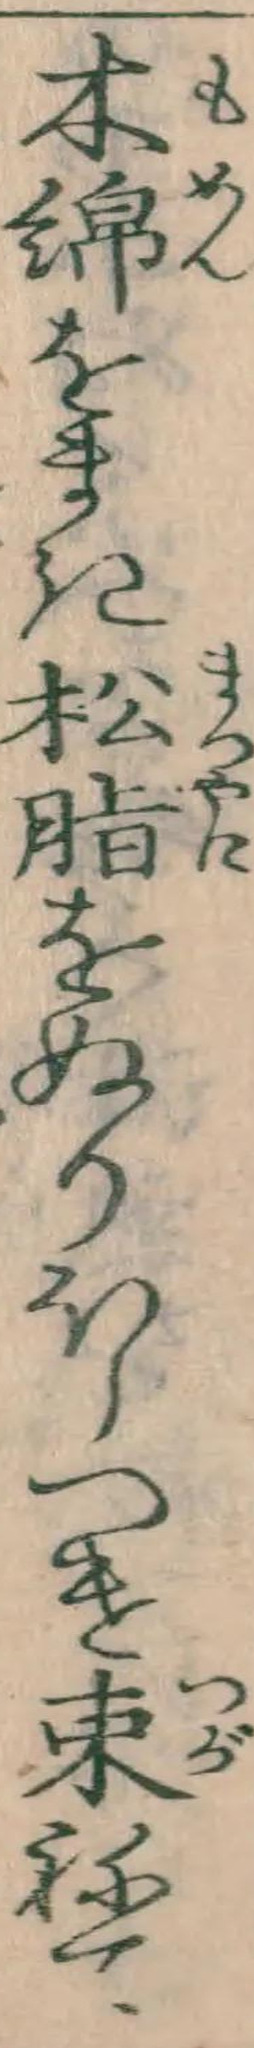木綿をまき松脂をぬりほしつけ束ねて
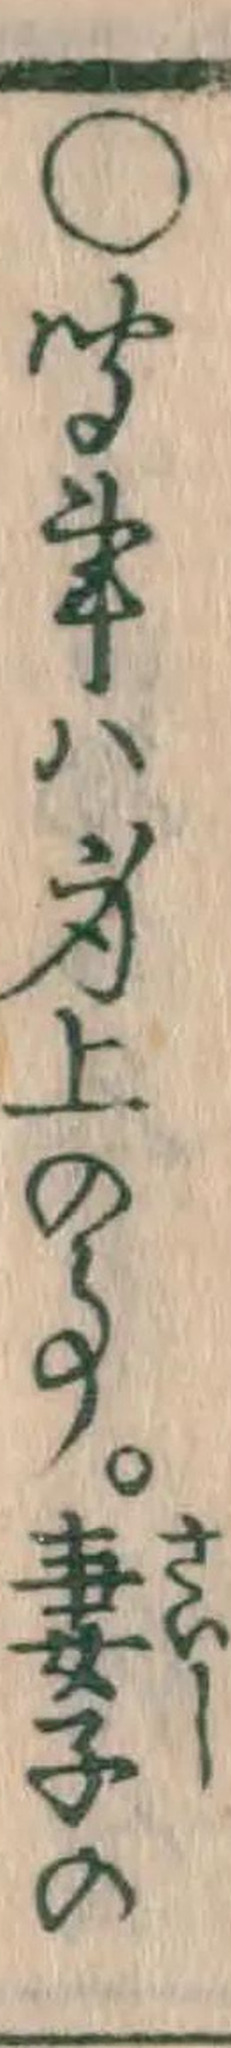○聞事は身上の事。妻子の
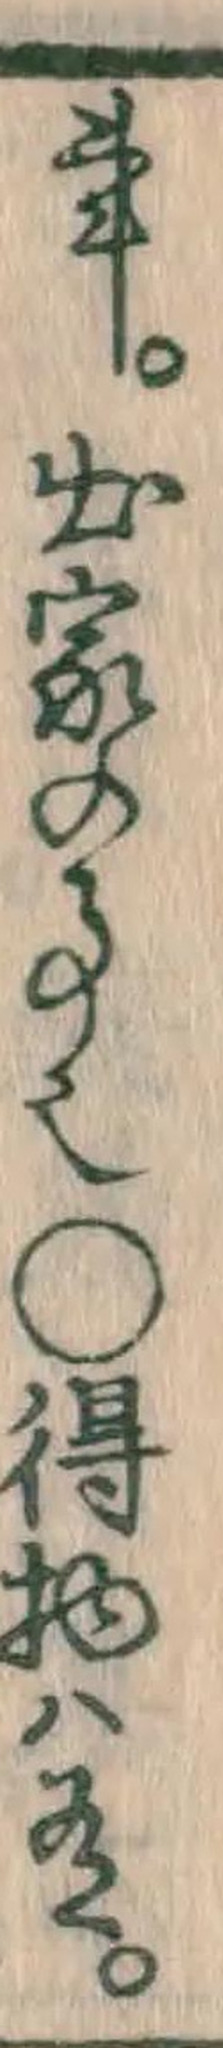事。出家の事也○得物は有。
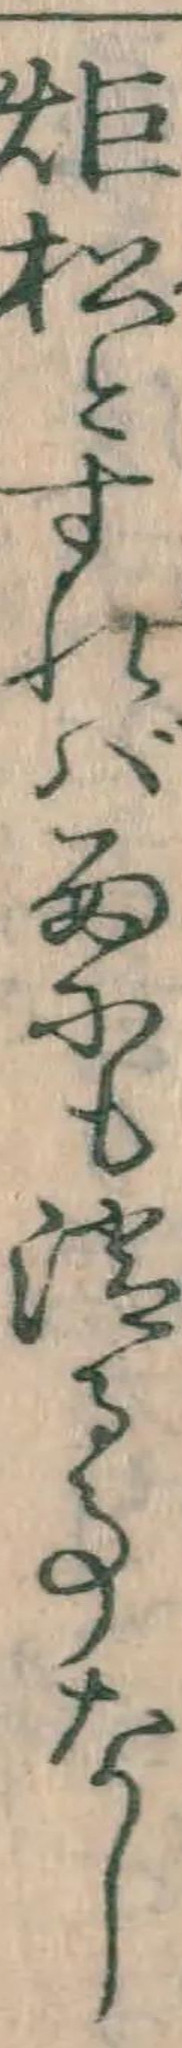炬松とすれば雨にも消る事なし
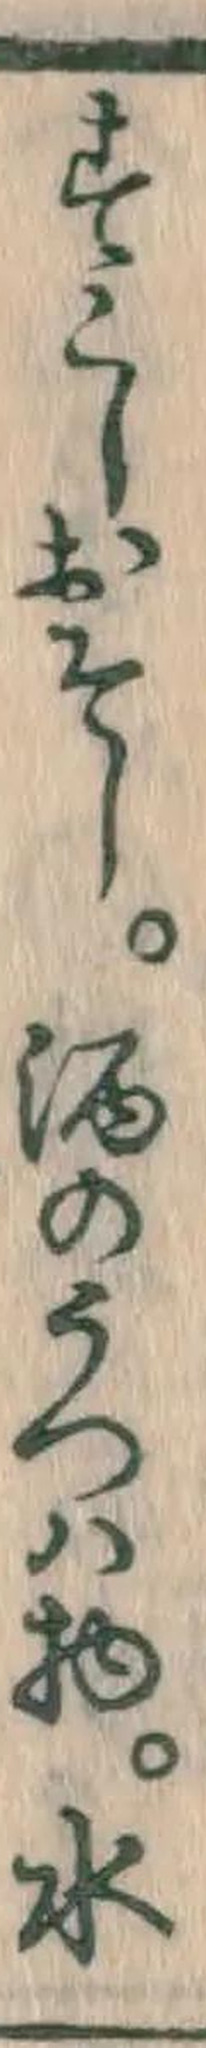すこしおそし。酒のうつは物。水
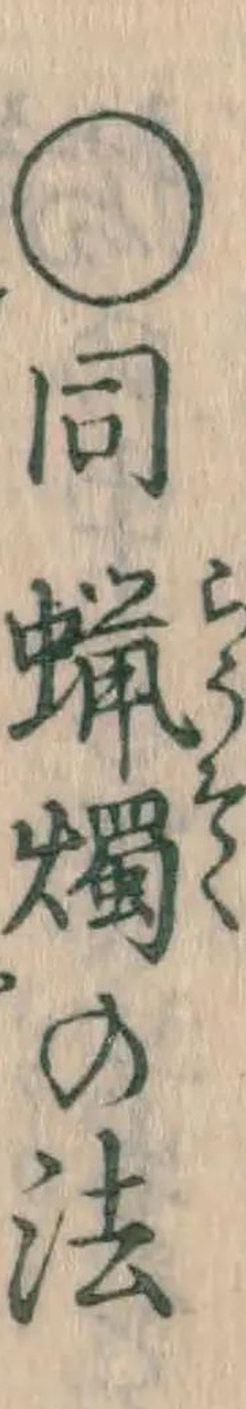○同蠟燭の法
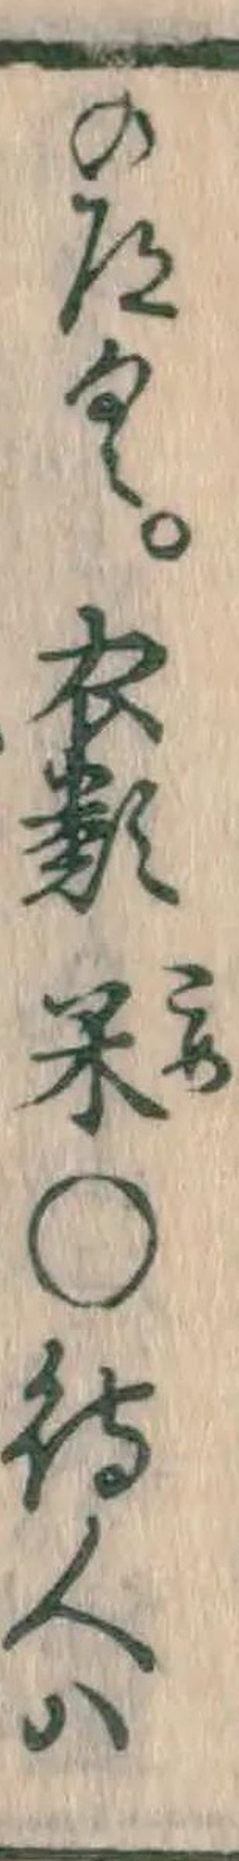の道具。衣類米○待人は
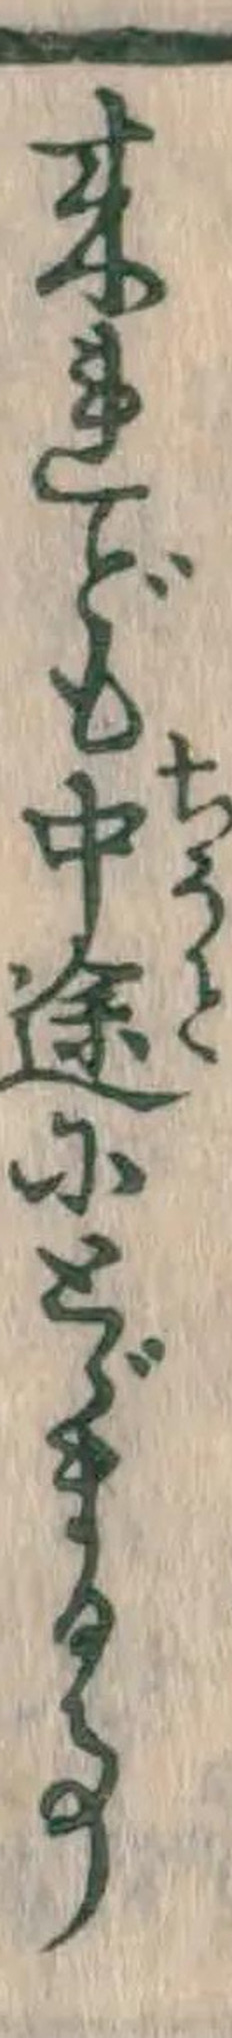来れども中途にとゞまる事
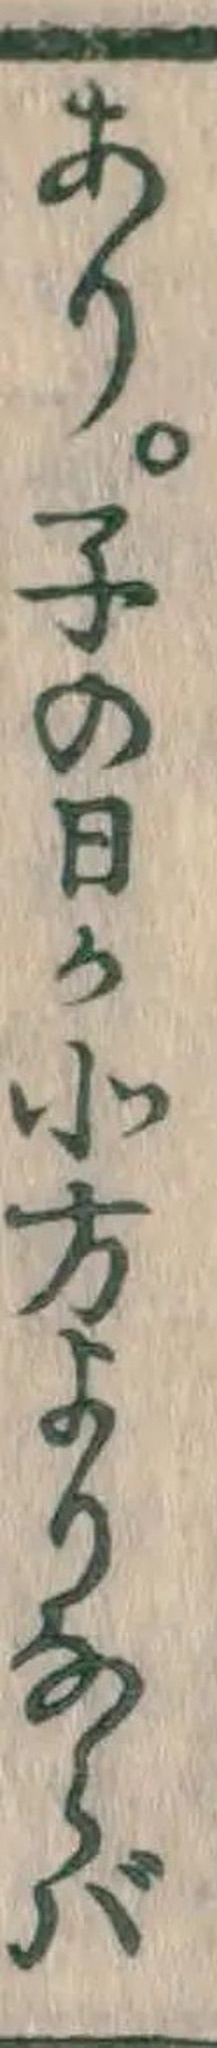あり。子の日か北方よりならば
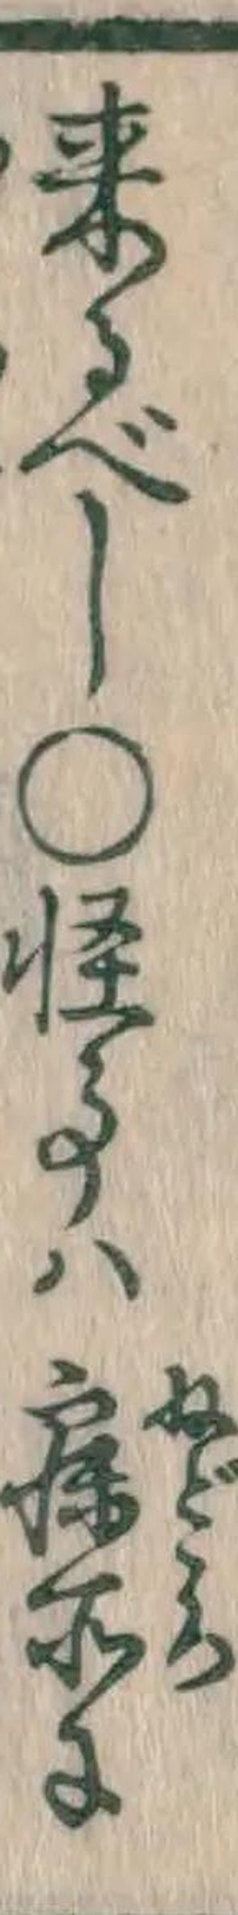来るべし○怪事は寝所に
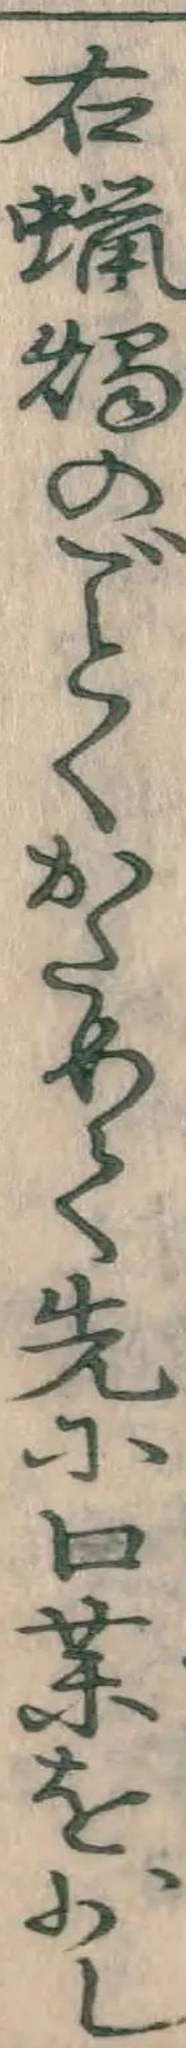右蠟燭のごとくかためて先に口薬を少し
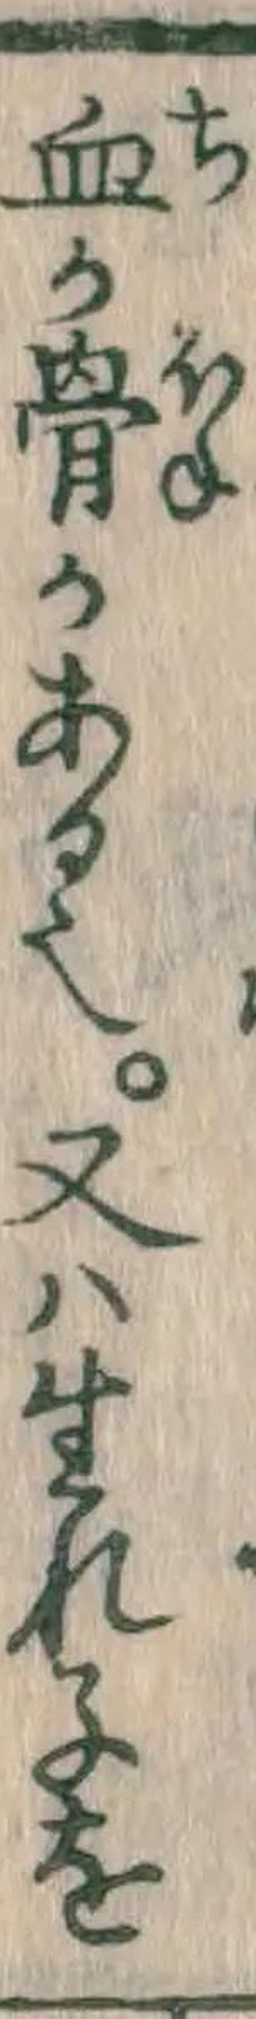血の骨かある也。又は生れ子を
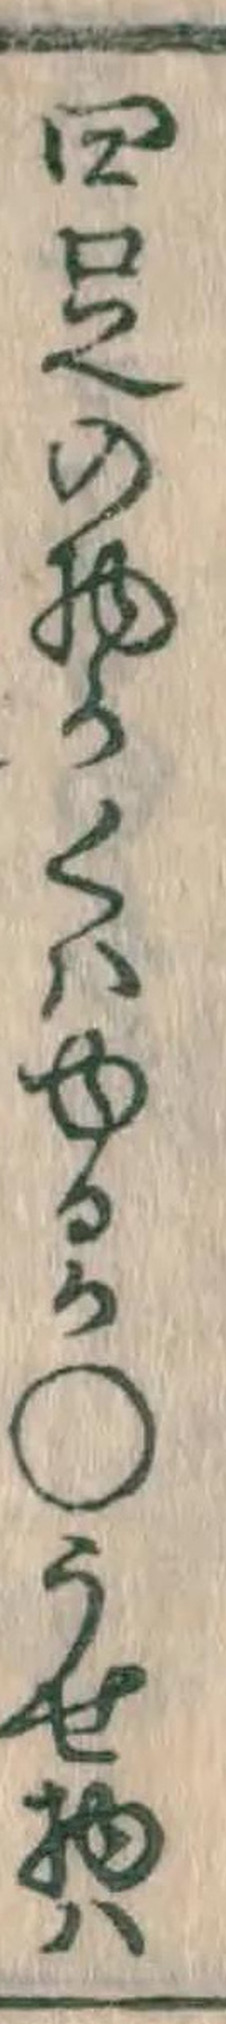四足の物かくはゆるか○うせ物は
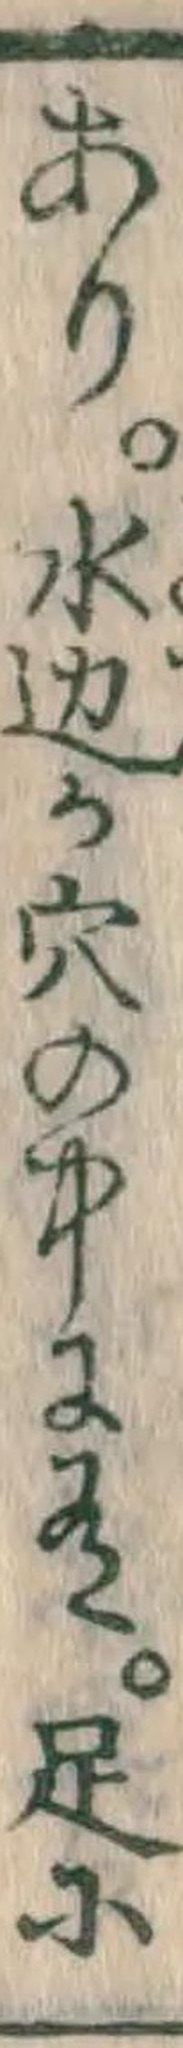あり。水辺か穴の中に有。足に
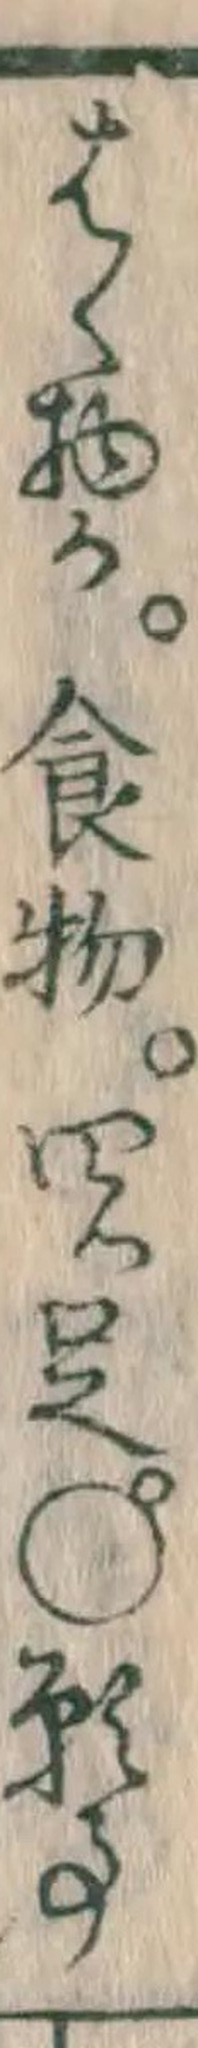はく物か。食物。四ッ足。○願事
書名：広益秘事大全 3巻. [1]
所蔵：国立国会図書館 National Diet Library, JAPAN
